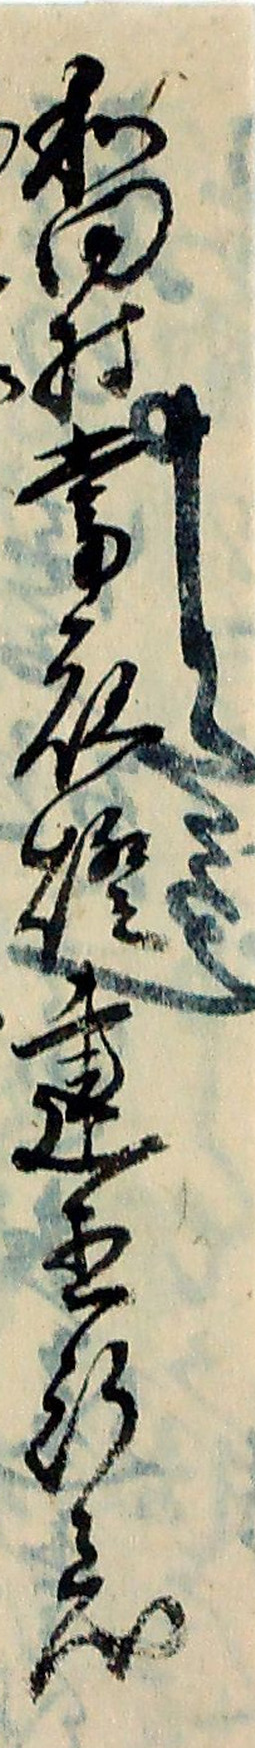和田村常夜灯建直行着
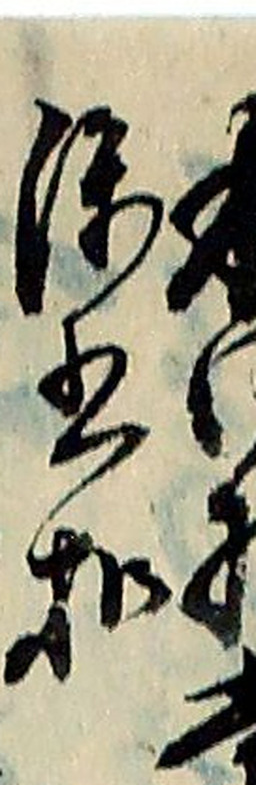添書扣
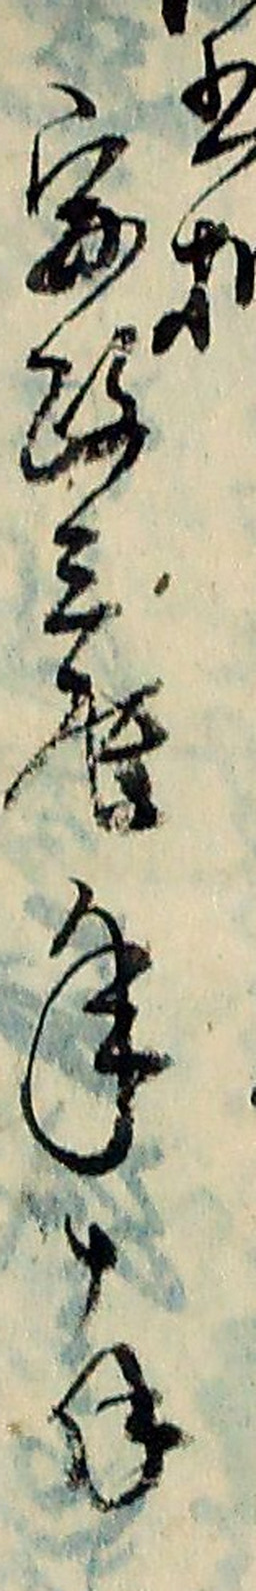安政三辰年十月

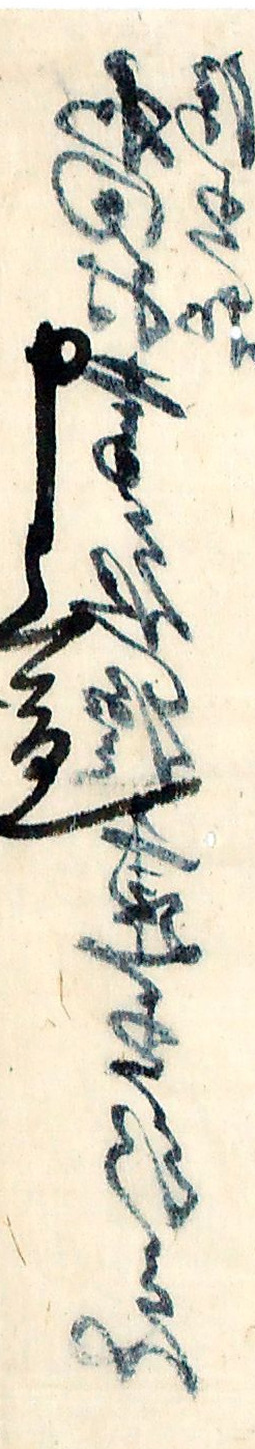申上覚
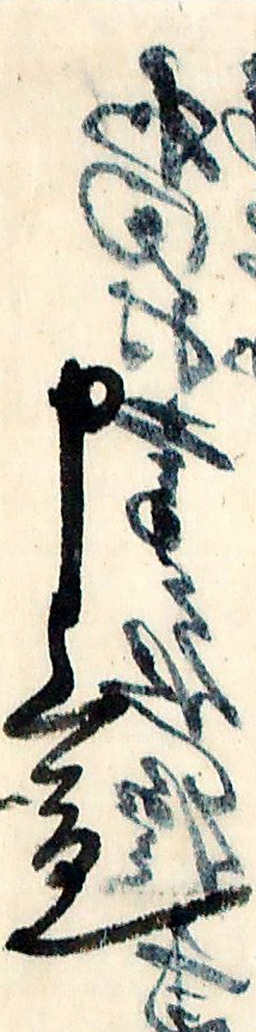申上覚
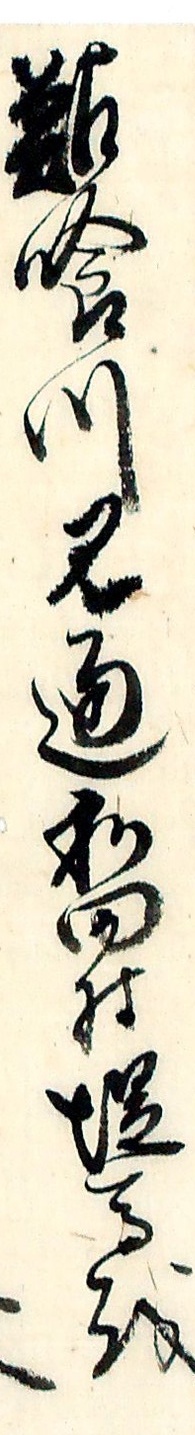鮎喰川見通和田村堤馬越
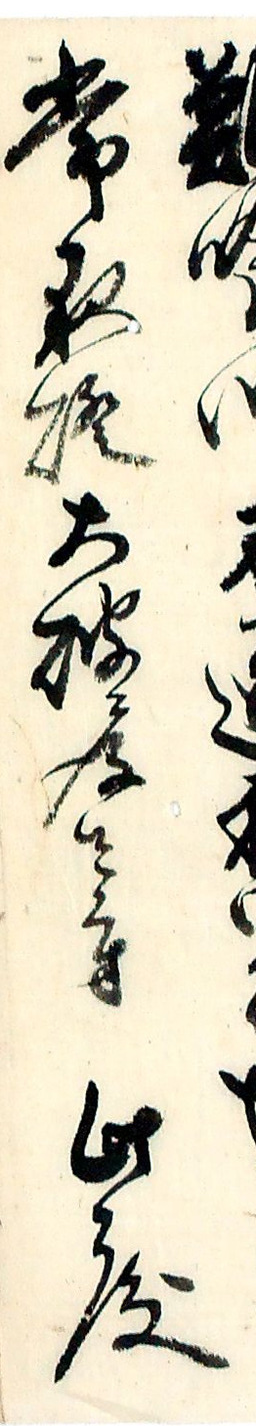常夜灯大破に及候に付此度
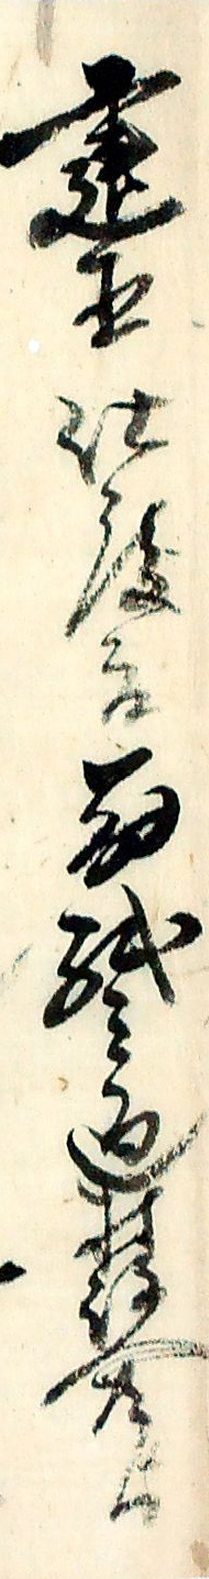建直仕度旨別紙之通村役人共ゟ
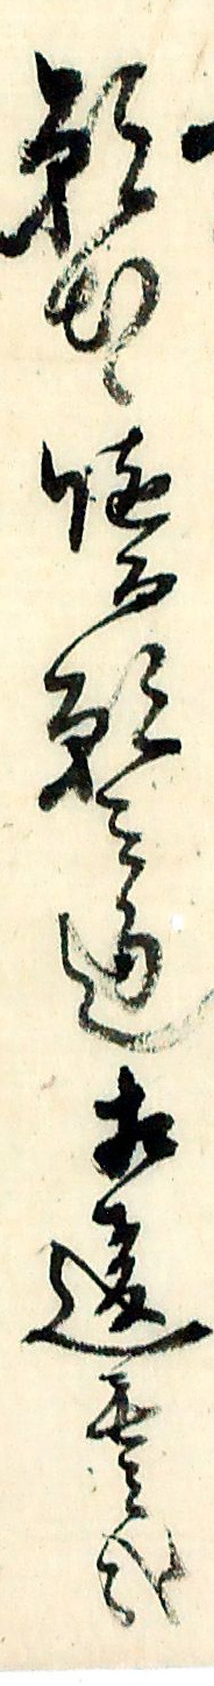願出候随て願之通相違無之哉
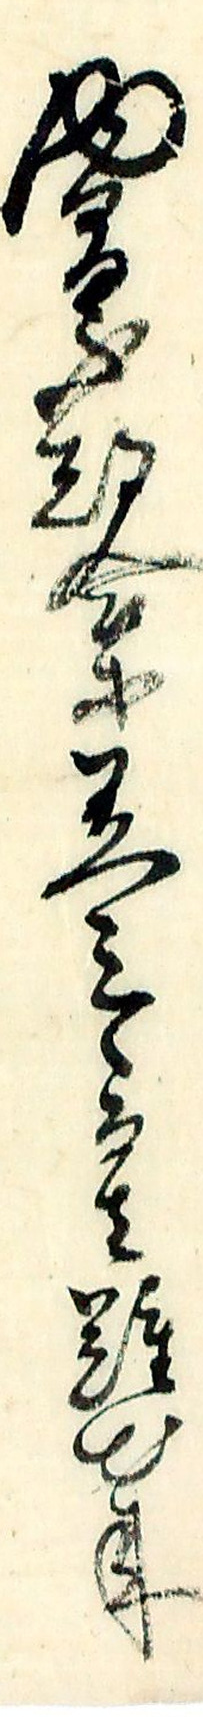内間不都合等有之候ては難出来
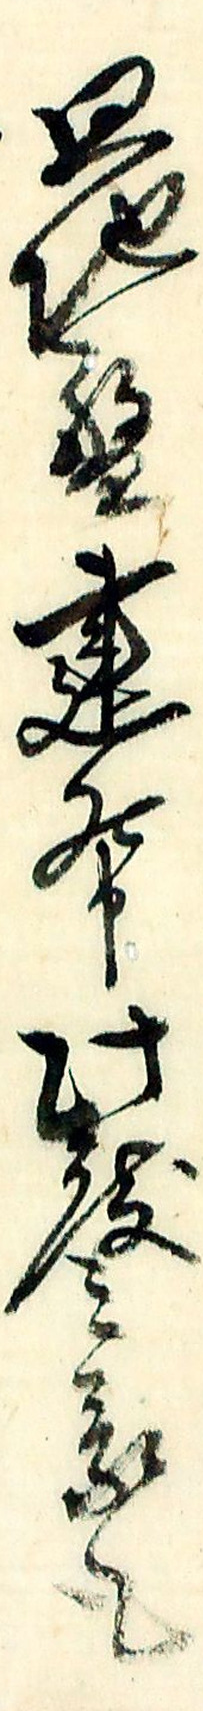且地盤建居中此度之義も
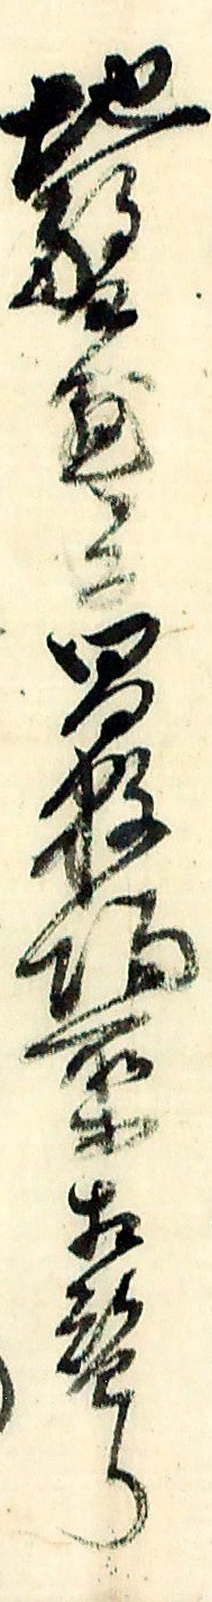地盤懸にて間数場所等相替り
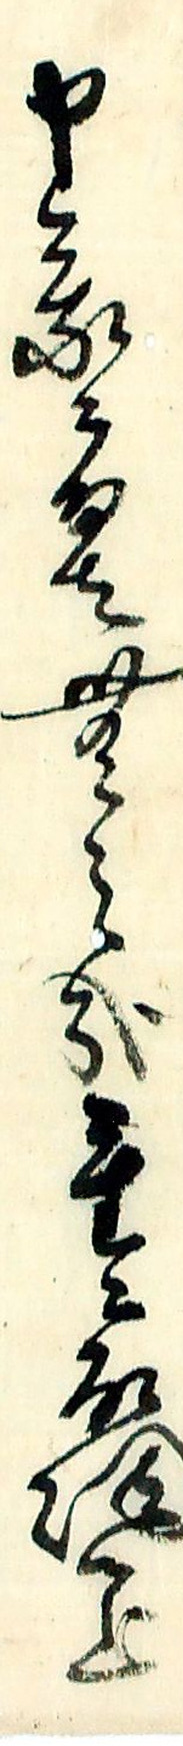申義にては無之哉重々取調候上
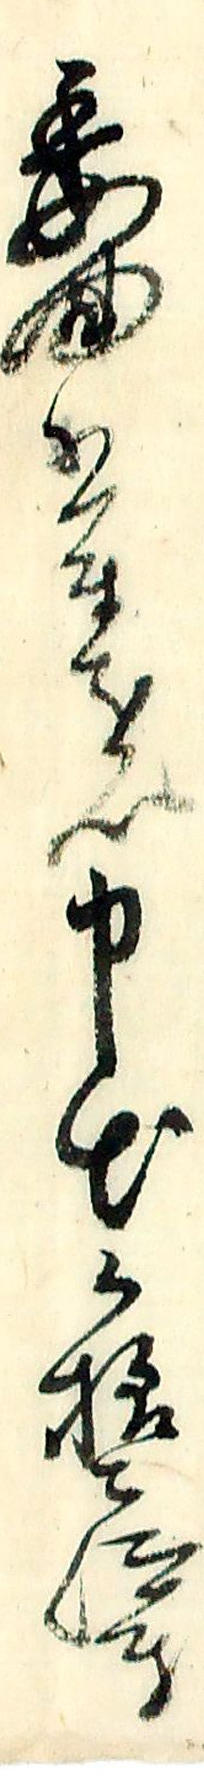委曲書付を以申出候様被仰付
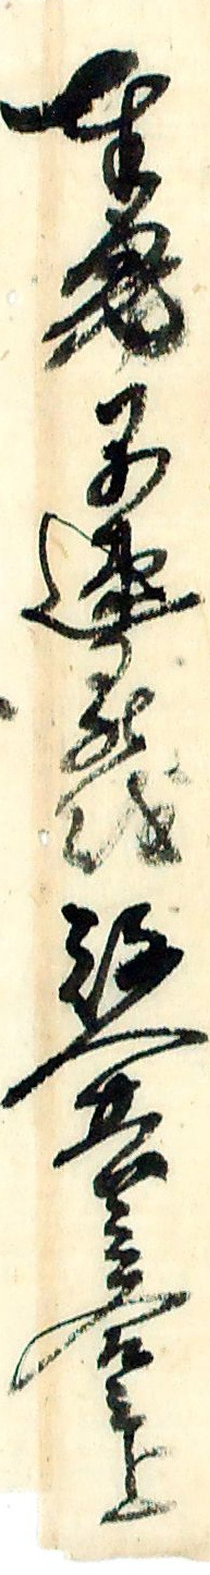奉畏早速罷越役人共立合之上
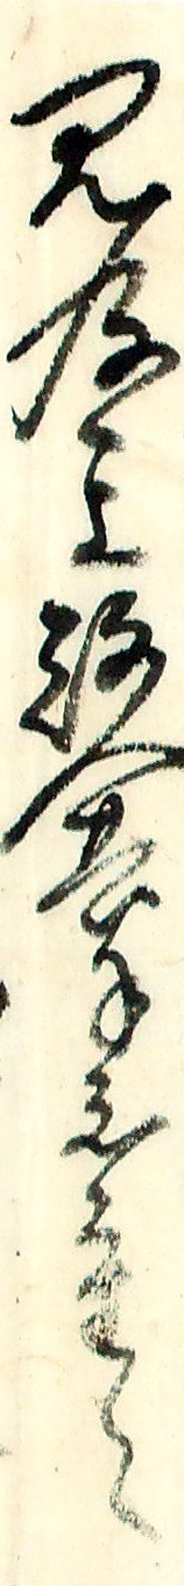見及候上役人共手元重々
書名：和田村常夜燈建直行着添書控
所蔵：鳴門教育大学 Naruto University of Education
